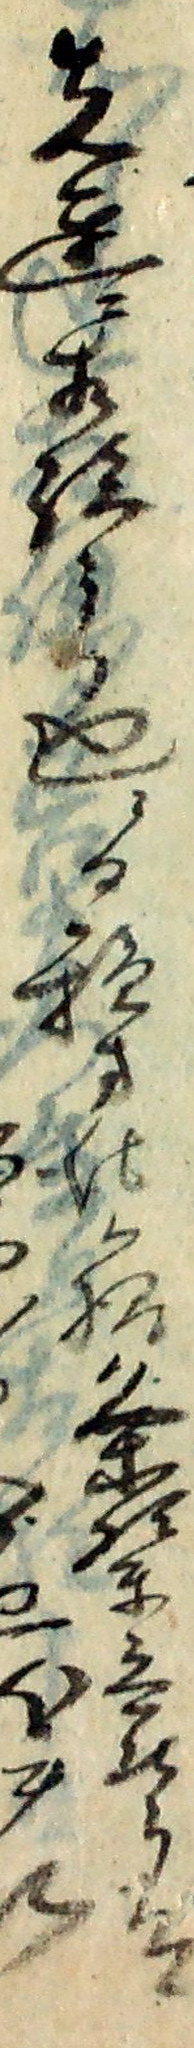先達に相談之通にて積方仕候様粂須米兵次郎殿
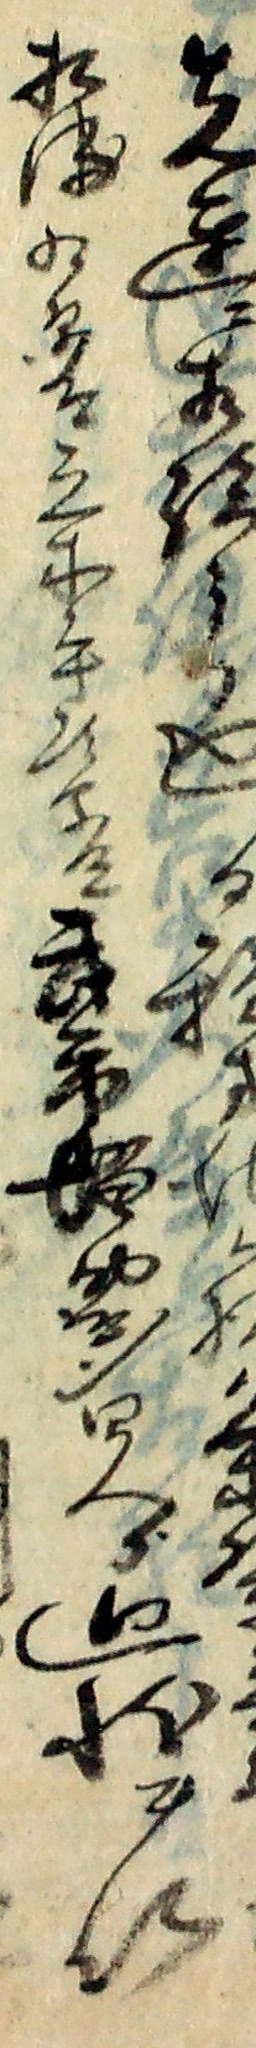松浦九兵衛殿元木平次衛殿武市増助殿〆四人ゟ廻状を以
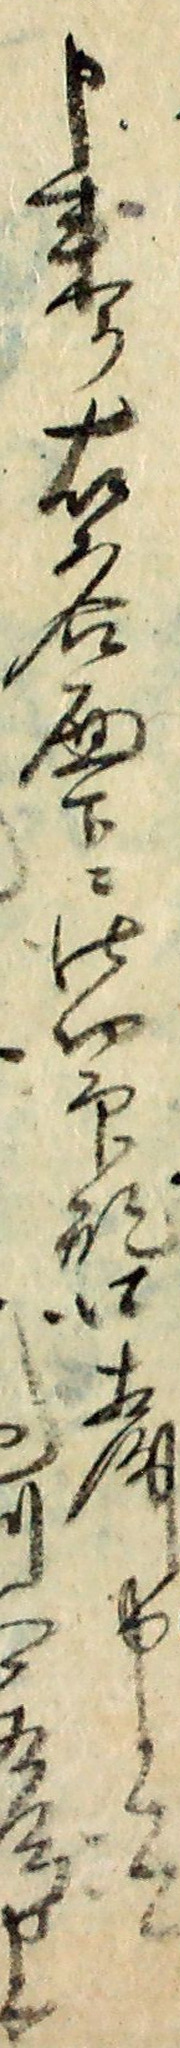申来り右名面下に仕切印形仕相渡し申上候
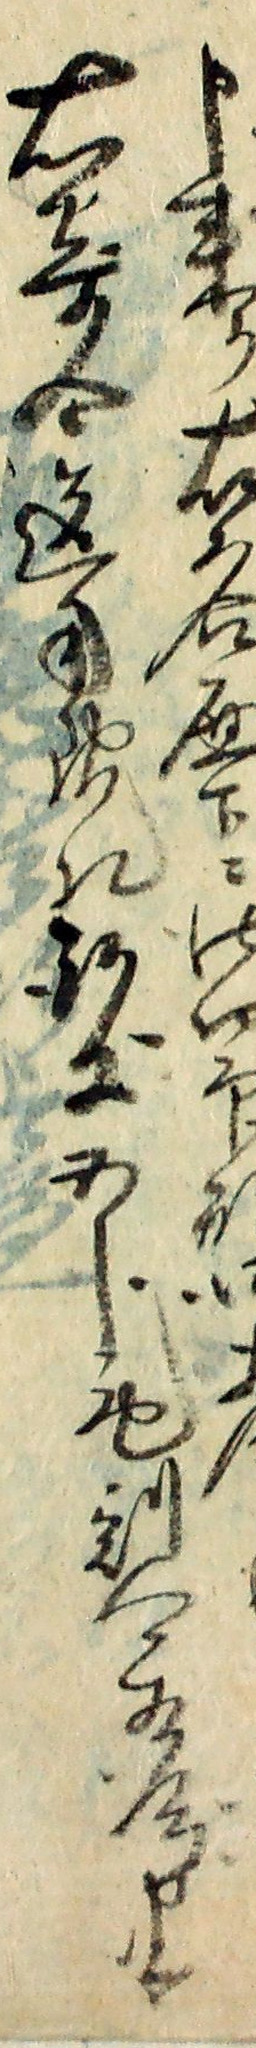右寄合造用銀札玖匁五分宛割合相渡申候
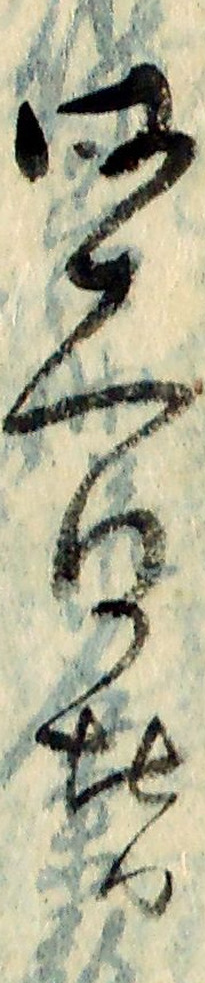戌十一月廿日

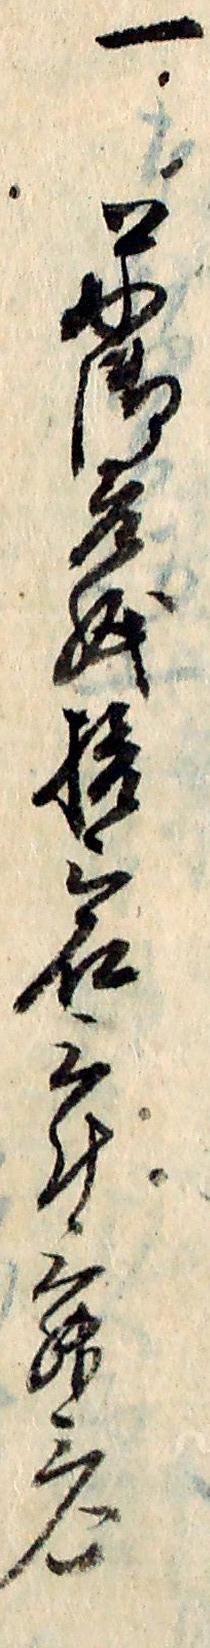一米御差紙拾三石三斗三升三合
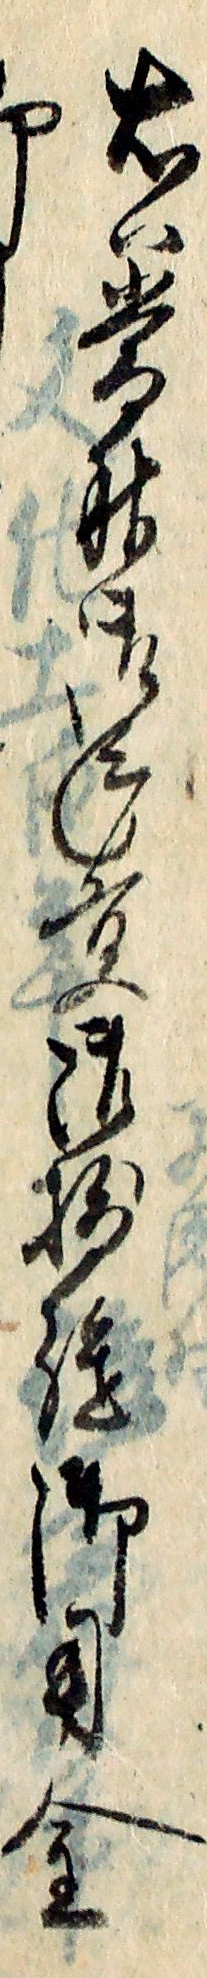右は当秋御年貢御指継御用金
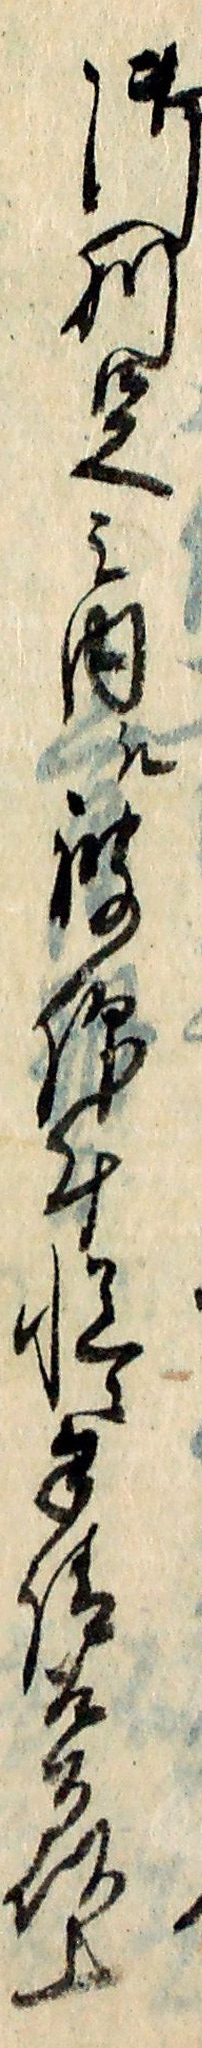御利足之内え被仰付慥に奉請取候以上
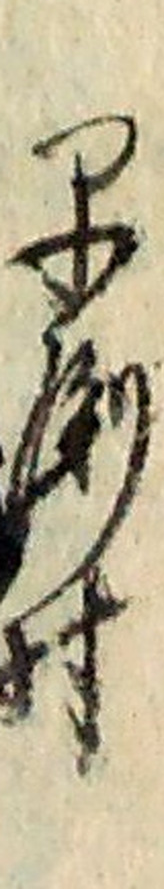早淵村
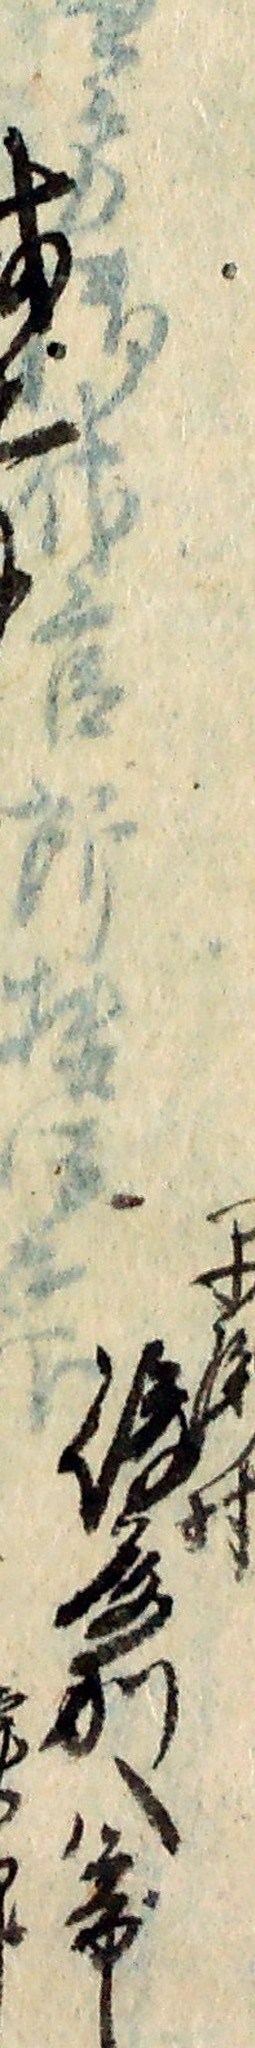後藤利八郎
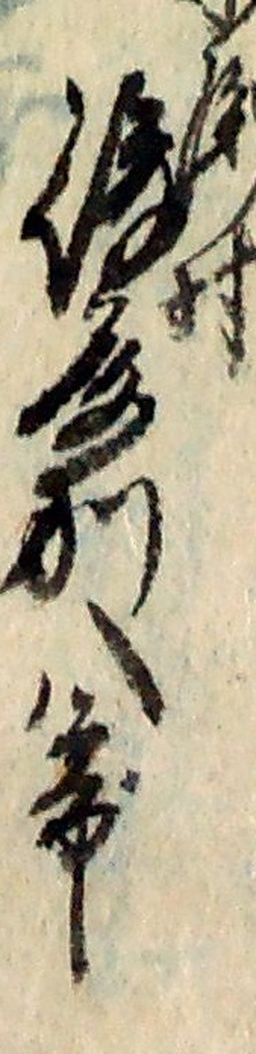後藤利八郎
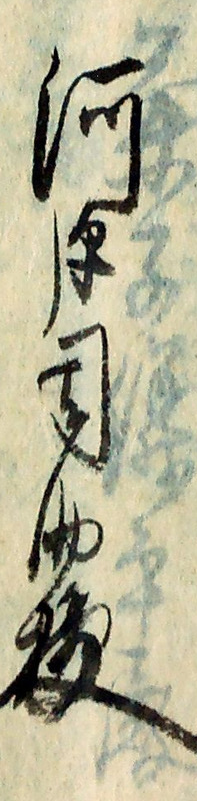河原周助様
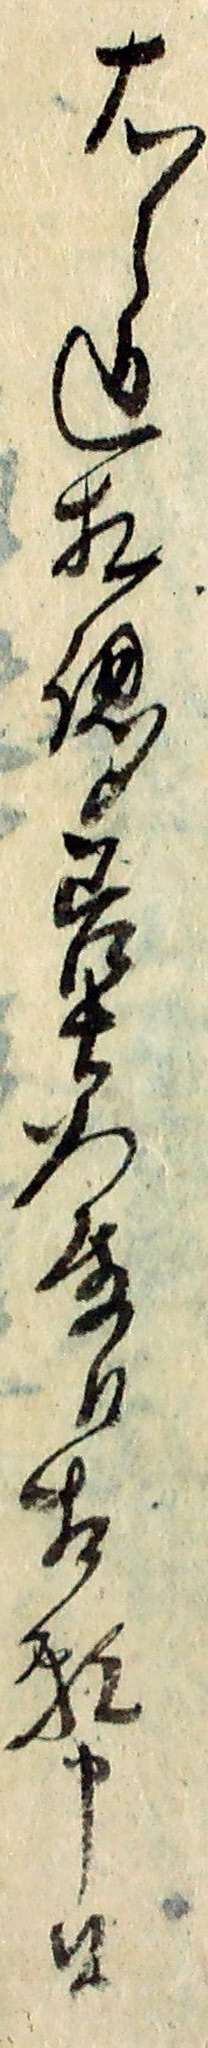右之通相認め善右衛門殿え相頼申候
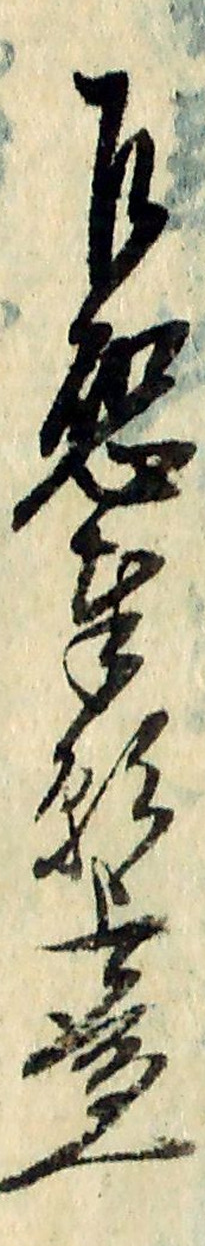乍恐奉願上候覚
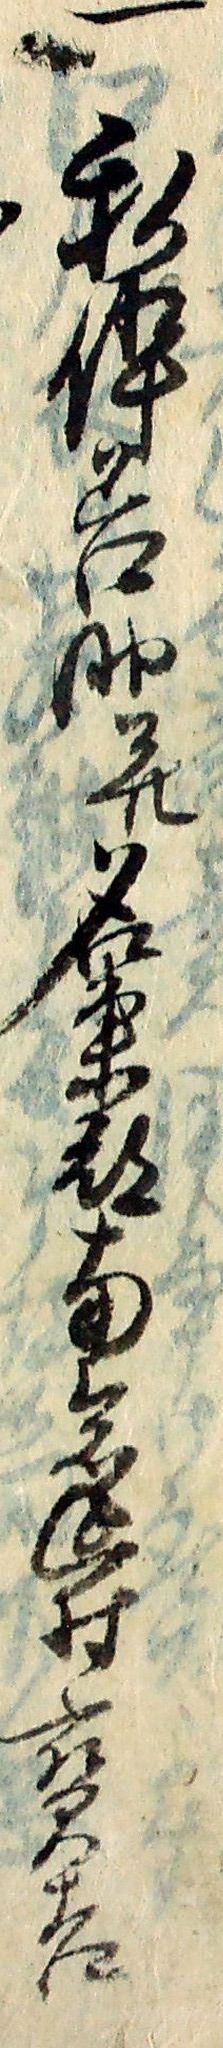一私倅善助并名東郡南岩延村宝吉
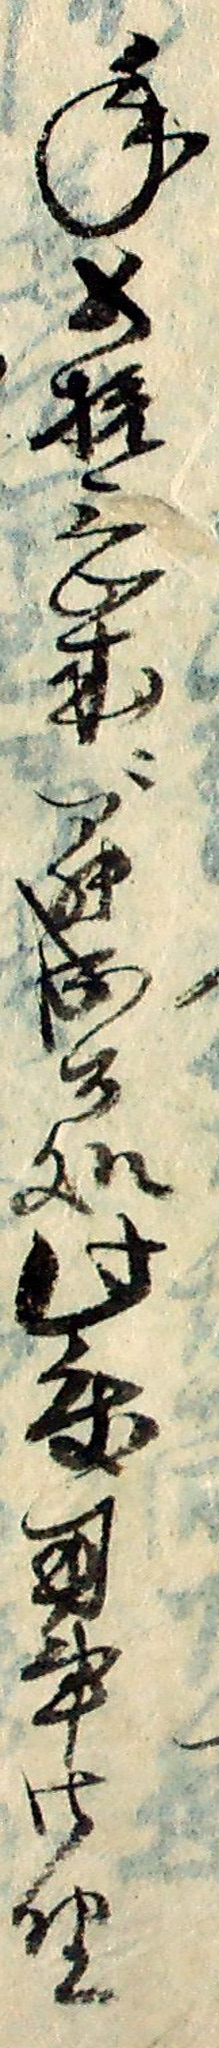年五拾三歳に罷成候処此度用事御座
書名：諸御願書控(後藤氏壱番）
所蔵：鳴門教育大学 Naruto University of Education
